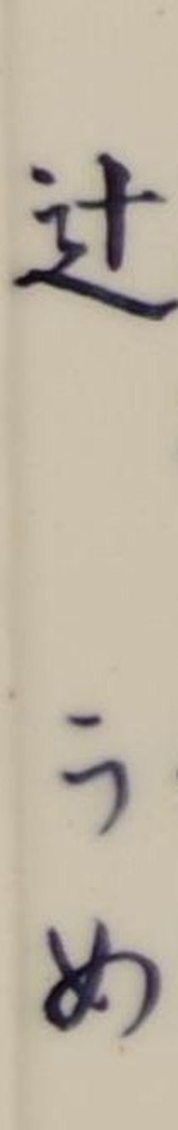辻うめ

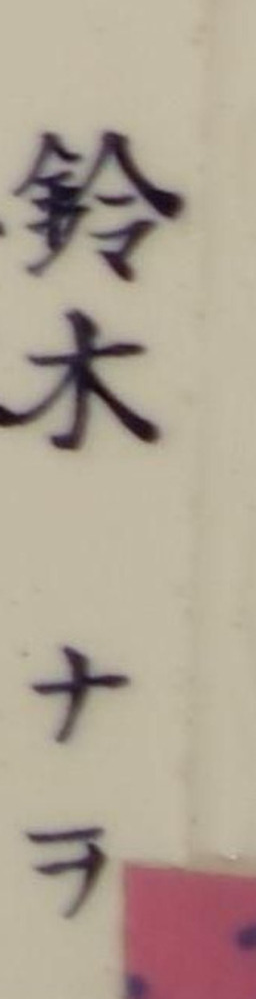鈴木ナヲ
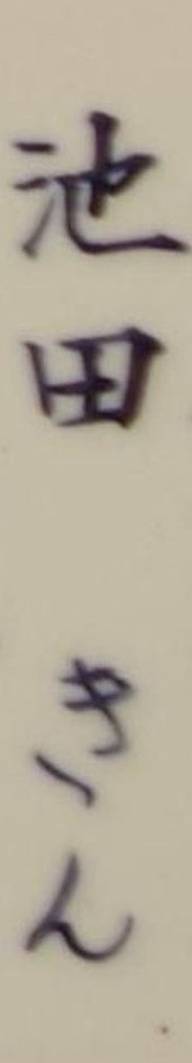池田きん
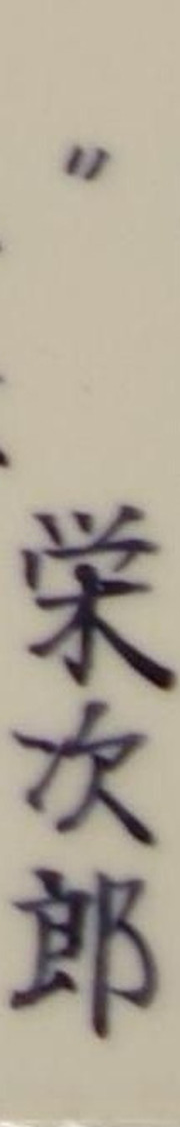栄次郎
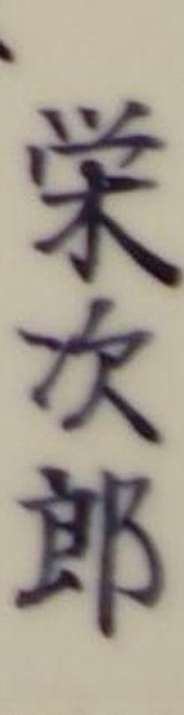栄次郎
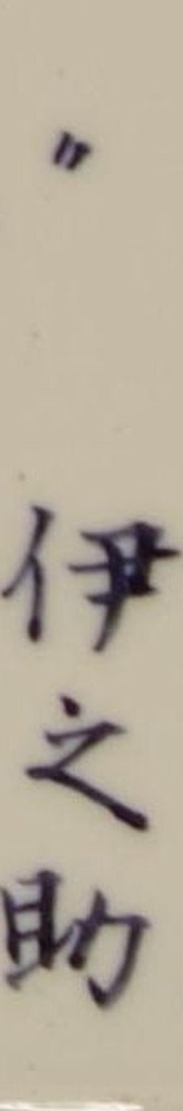伊之助
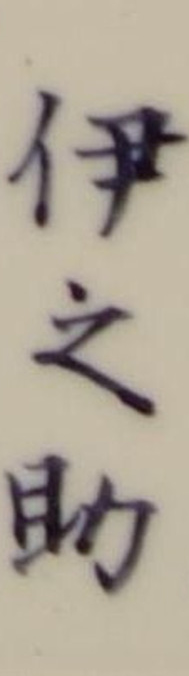伊之助
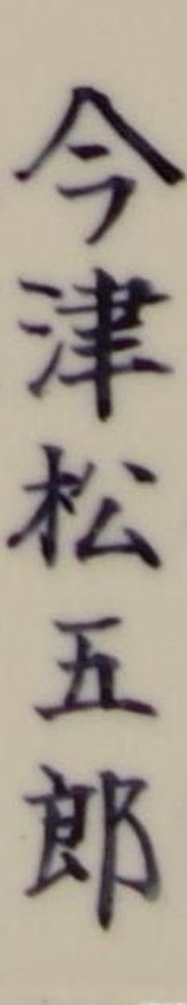今津松五郎
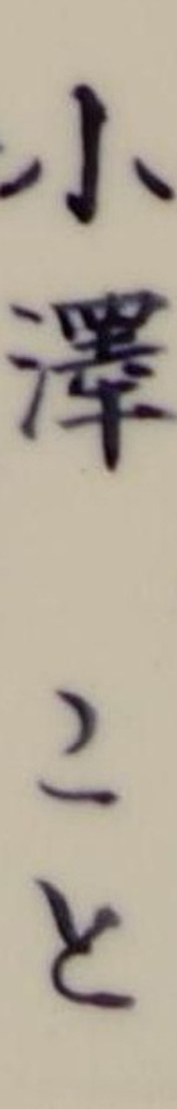小澤こと
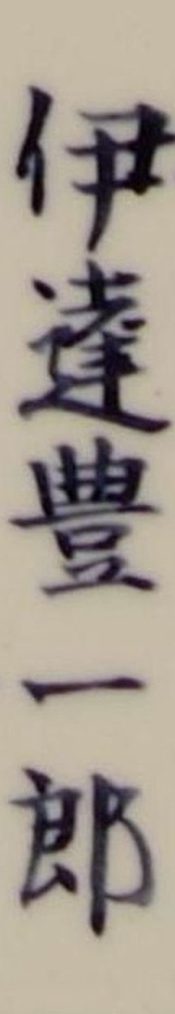伊達豊一郎
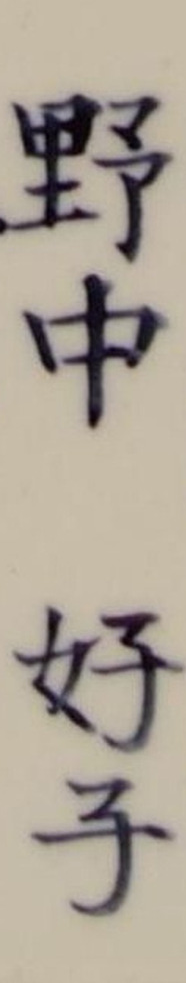野中好子
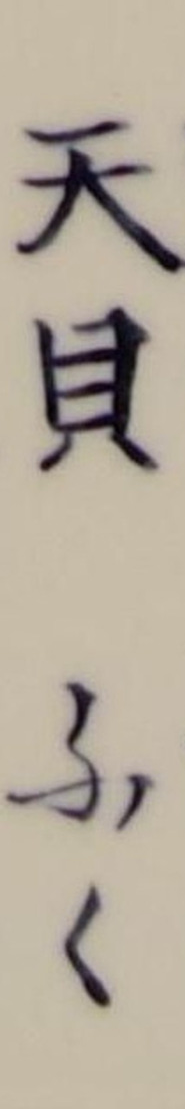天貝ふく
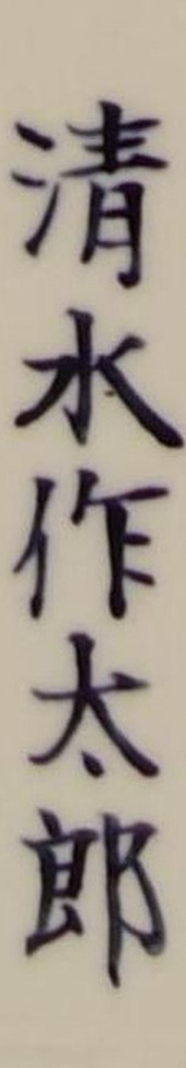清水作太郎
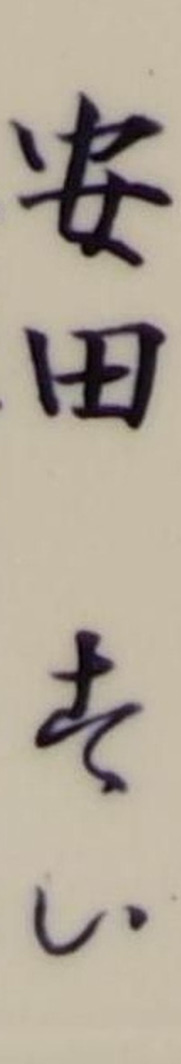安田すい
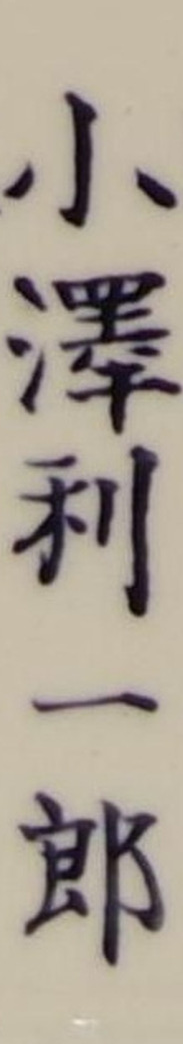小澤利一郎
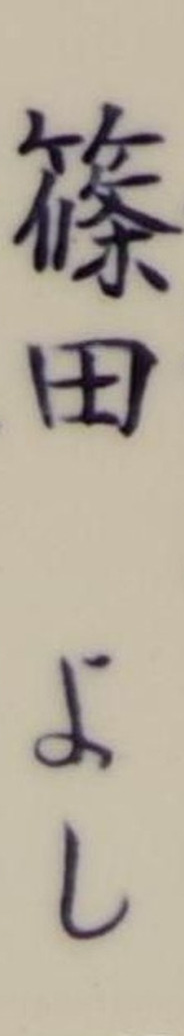篠田よし
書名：M~S
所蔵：高野山金剛峯寺
